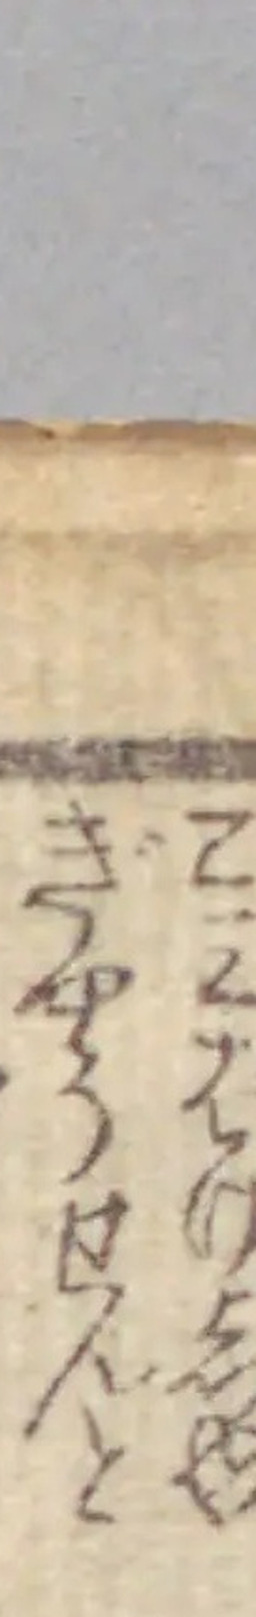ぎやうせんと
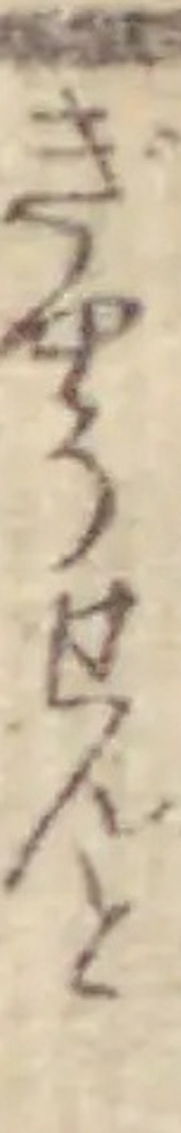ぎやうせんと
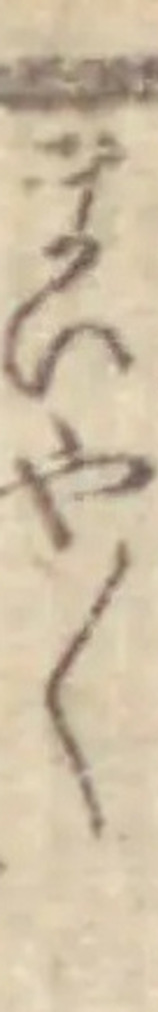まいや〳〵
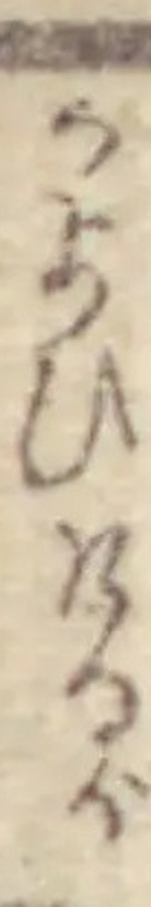かよひけるが
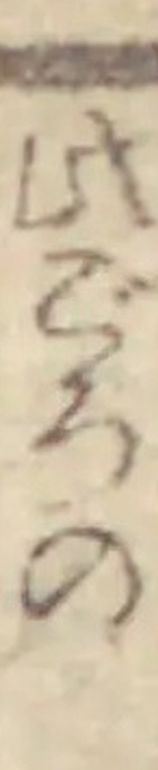此ごろの
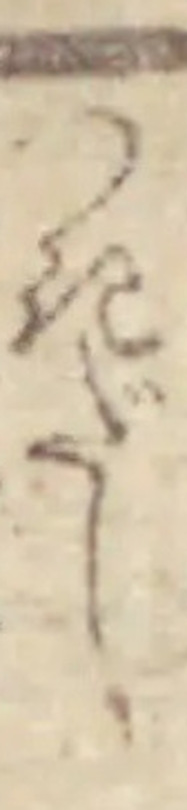つきだし
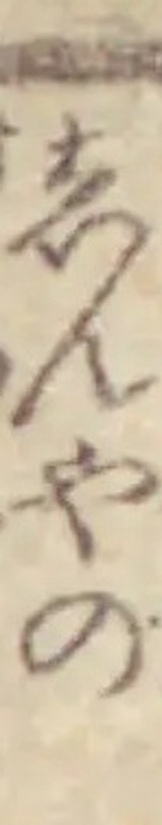しんやの
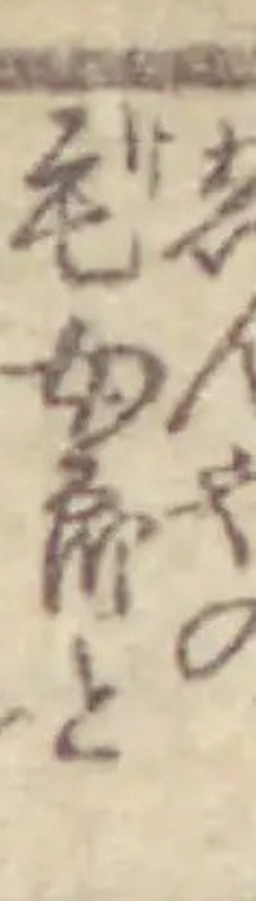毛女郎と
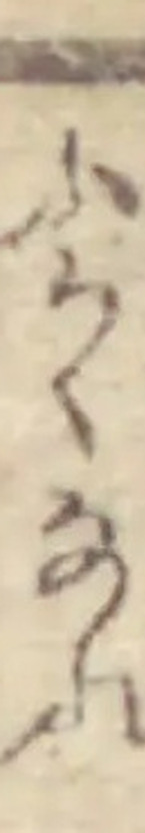ふかくなれ
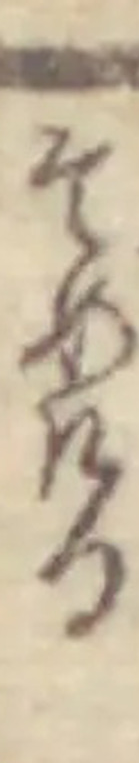そめける
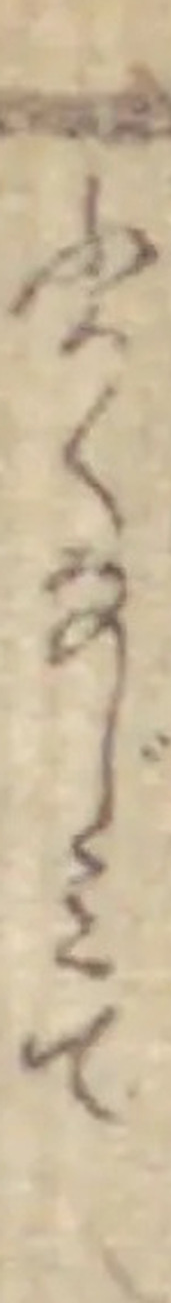ふかくなじみて
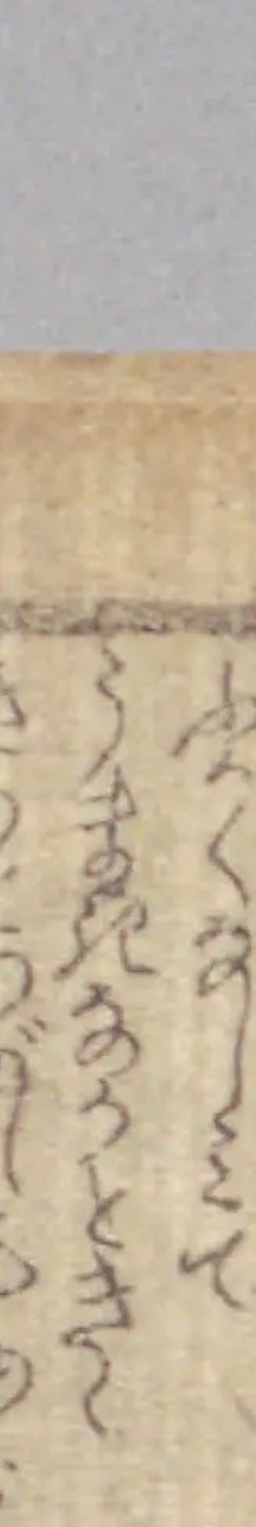うまきなかときゝて
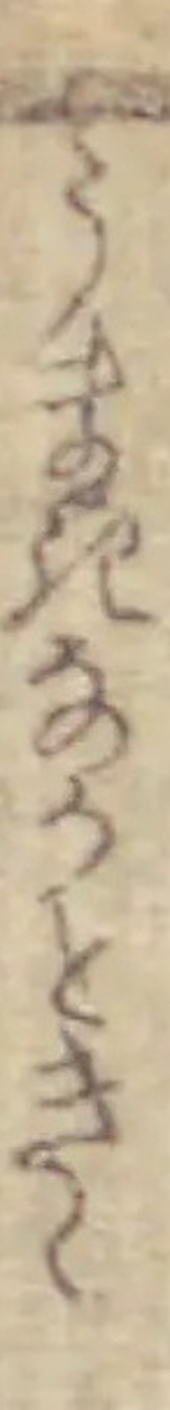うまきなかときゝて
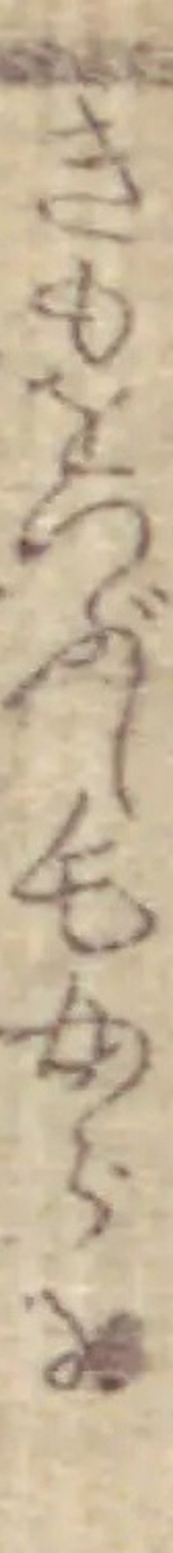きもをつぶし毛女郎
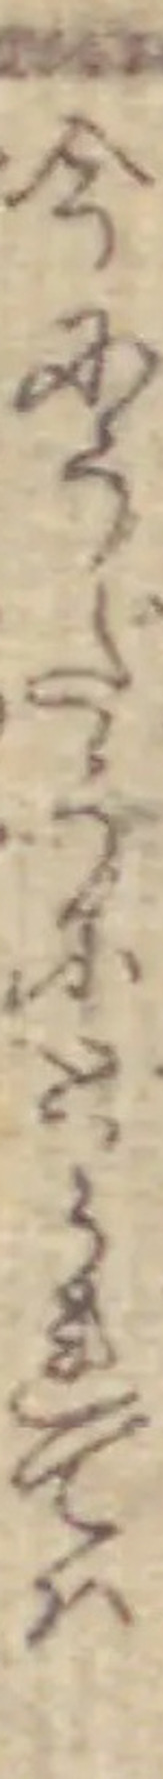今にうだうにとられては
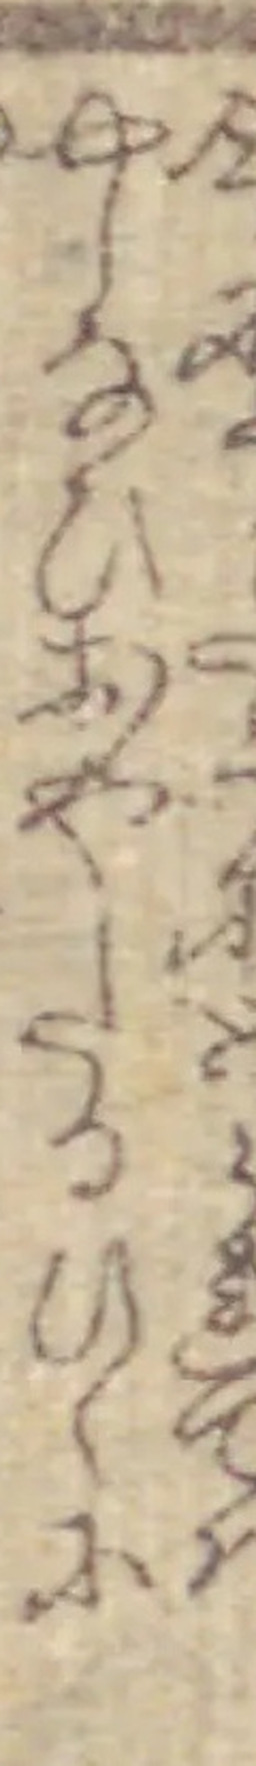やしなひおやしたるひゝに
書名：大昔化物双紙 2巻
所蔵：国立国会図書館 National Diet Library, JAPAN
